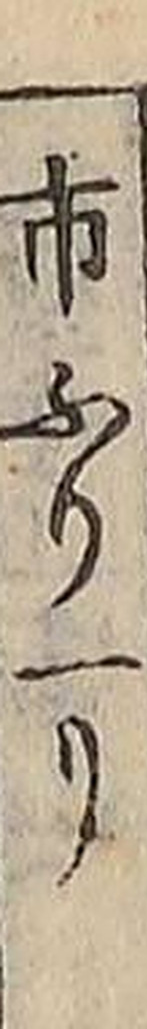市ふり一リ
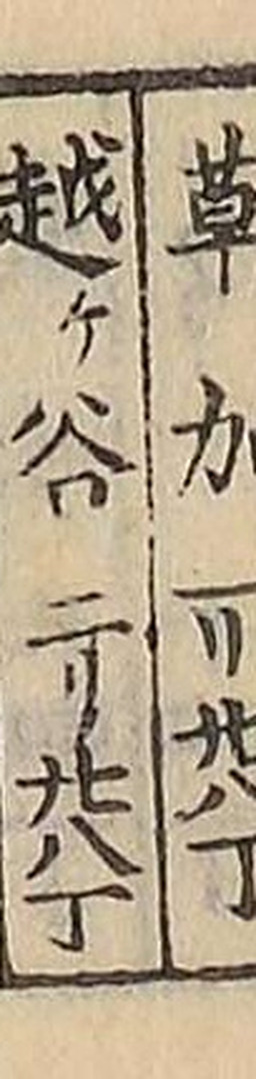越ケ谷二リ廿八丁
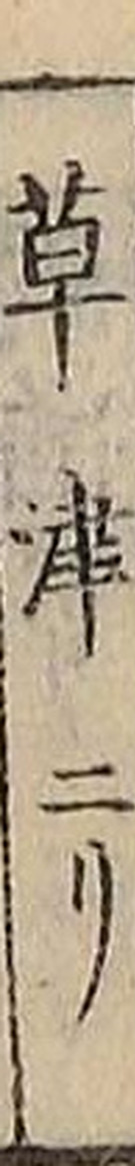草津二リ
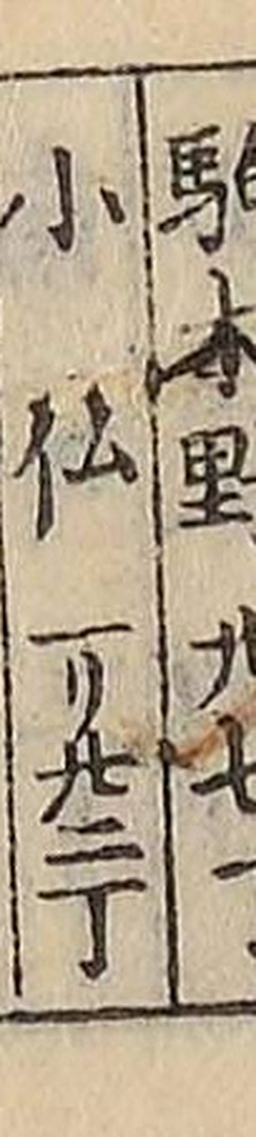小仏一リ廿二丁
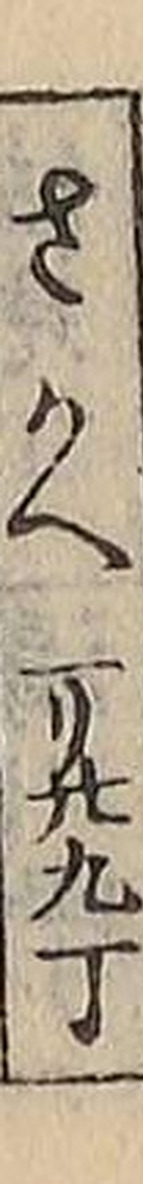さかへ一リ廿九丁
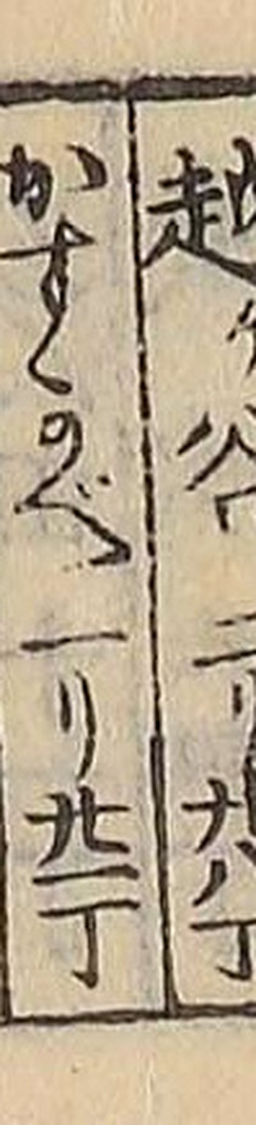かすかべ一リ廿一丁
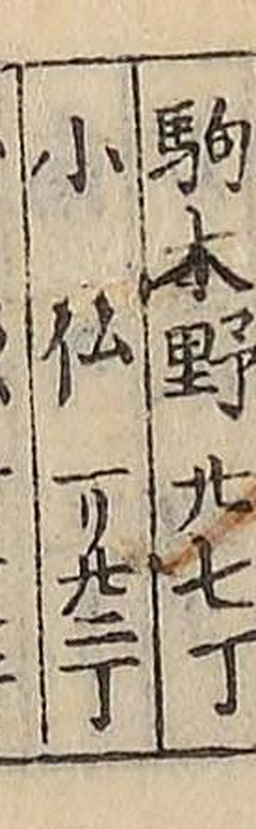小仏一リ廿二丁
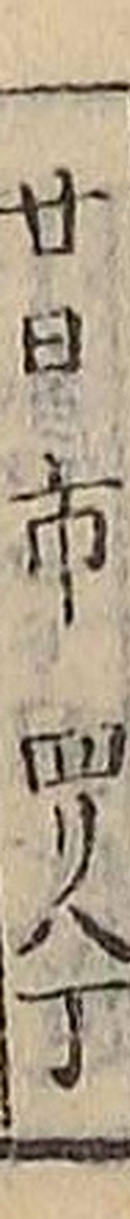廿日市四リ八丁
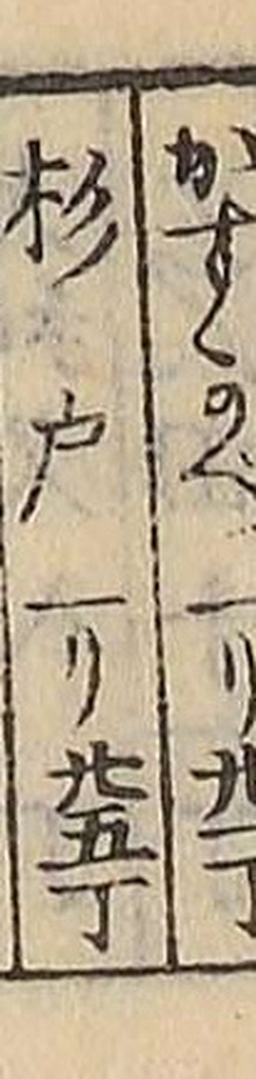杉戸一リ廿五丁
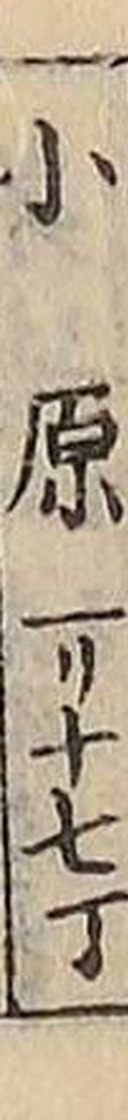小原一リ十七丁
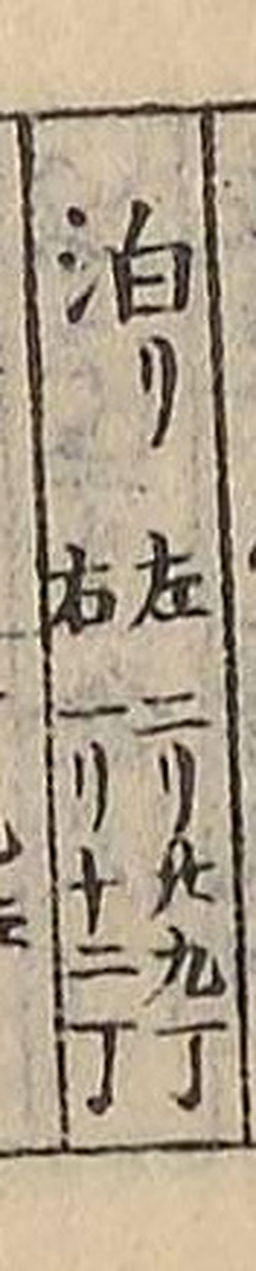犬目一リ十二丁
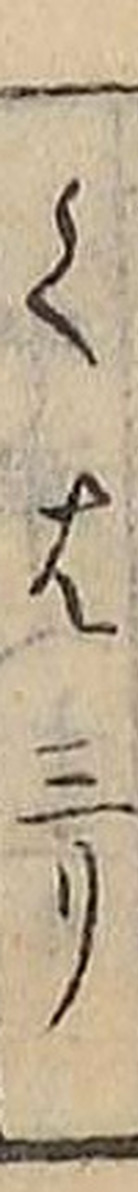くは三リ
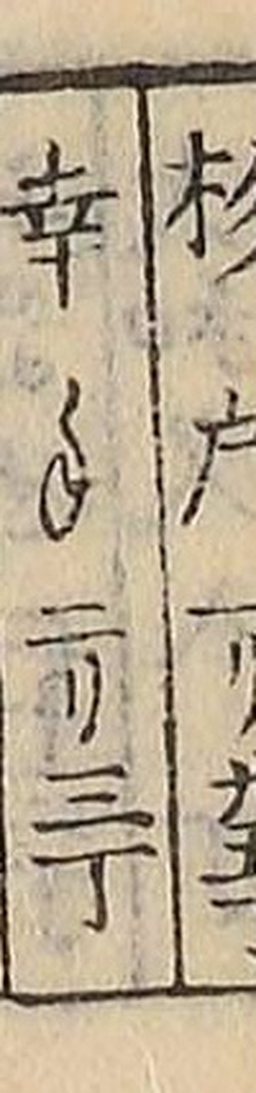幸手二リ三丁
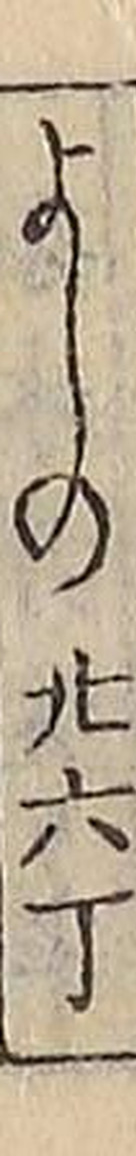よしの廿六丁
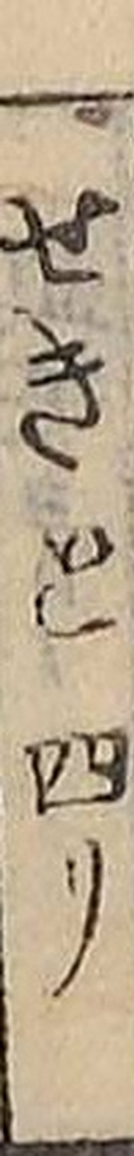せきと四リ
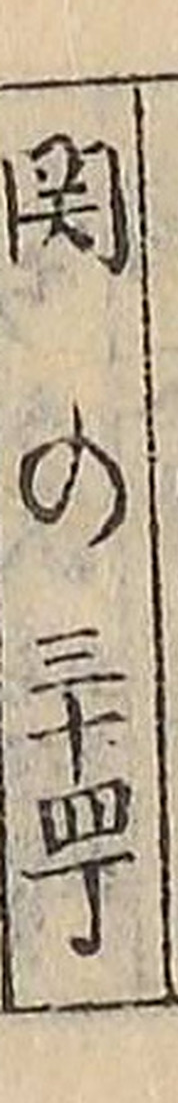関の三十四丁
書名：旅行用心集
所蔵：神戸大学附属図書館 国文学研究資料館
